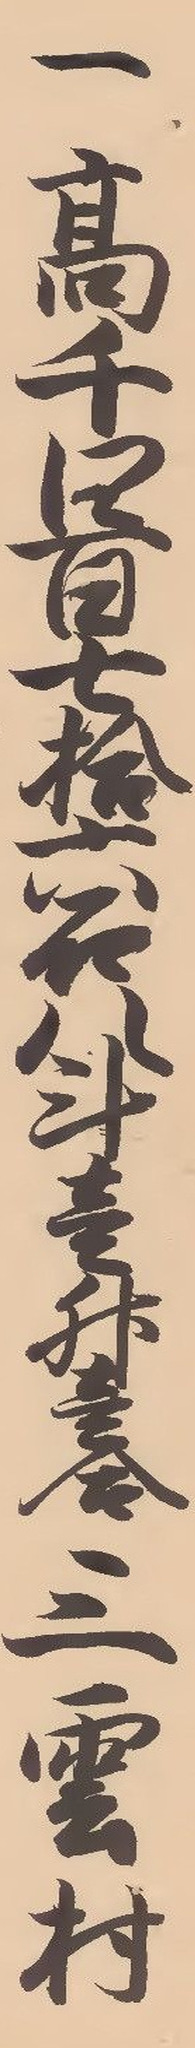一高千四百七拾六石八斗壱升壱合三雲村
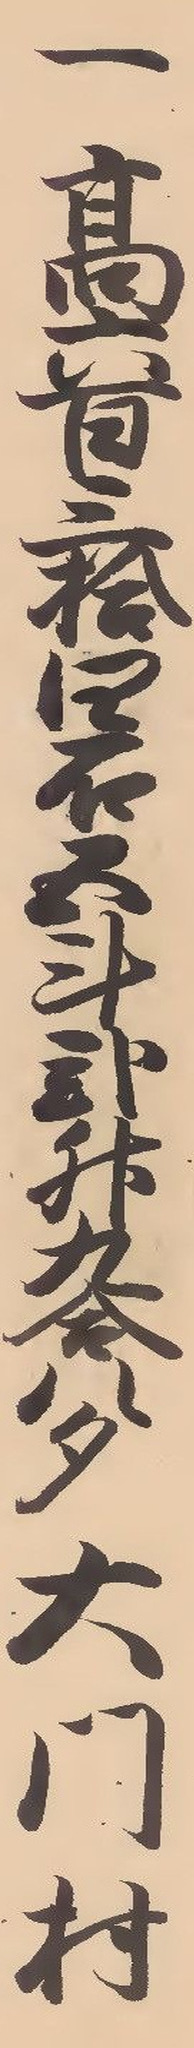一高六百三拾四石五斗弐升九合八勺大門村
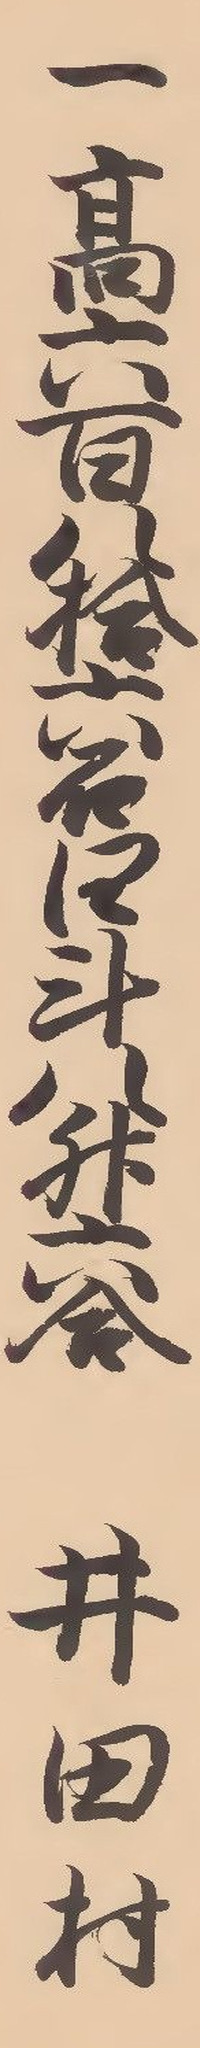一高六百八拾六石四斗八升六合井田村
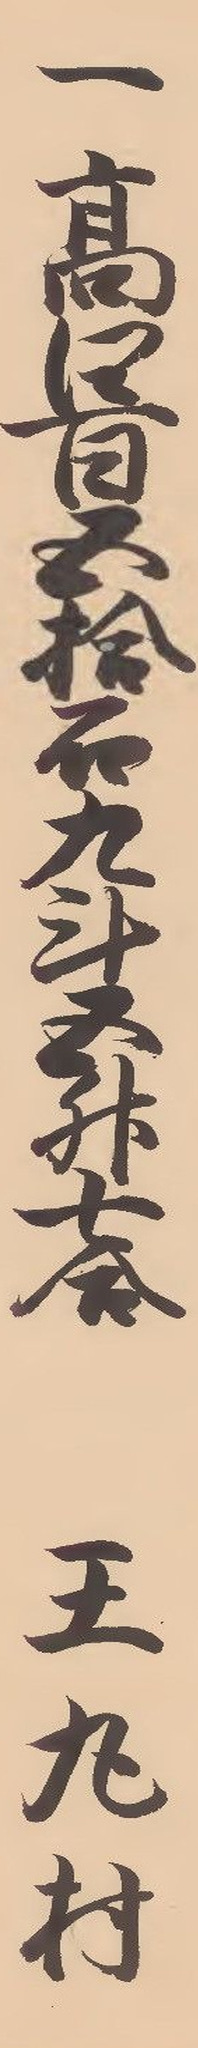一高四百五拾石九斗五升七合王丸村
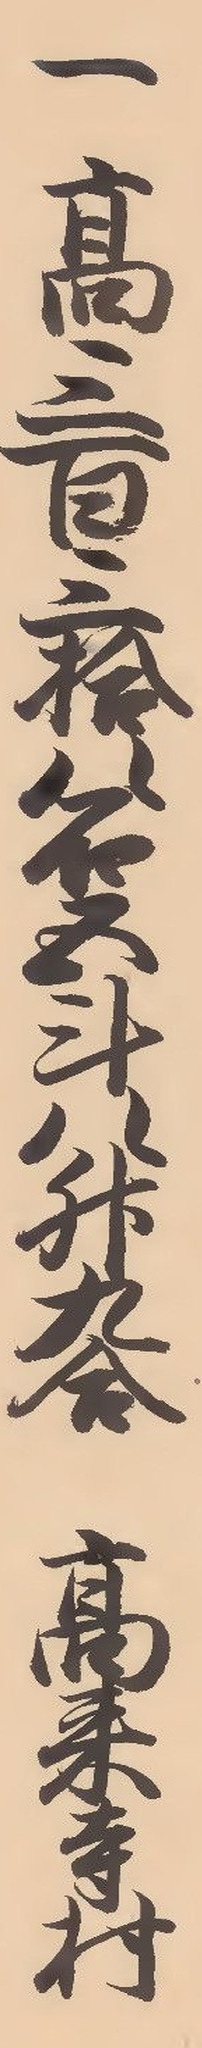一高三百三拾八石五斗八升九合高来寺村
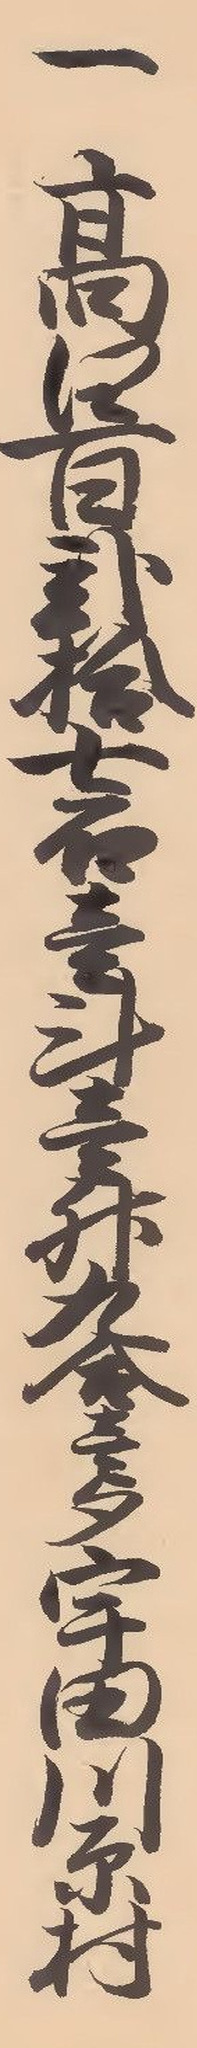一高四百弐拾七石壱斗壱升九合壱勺宇田川原村
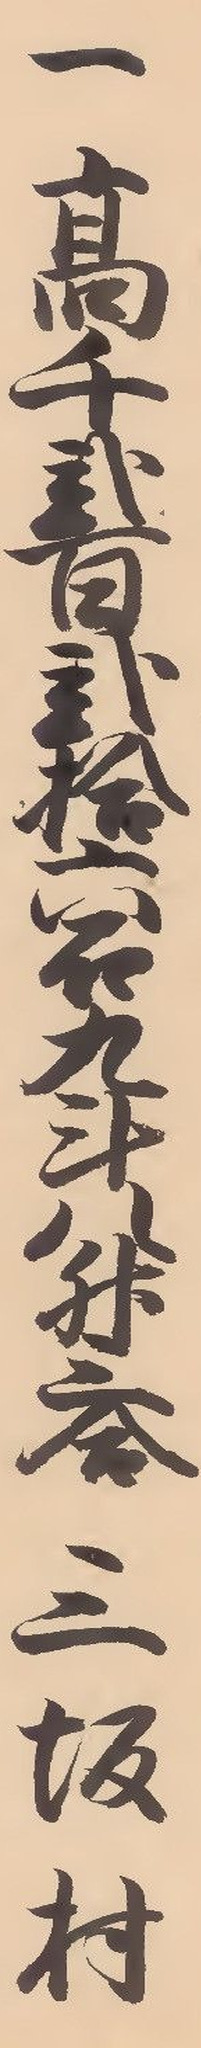一高千弐百弐拾六石九斗八升三合三坂村
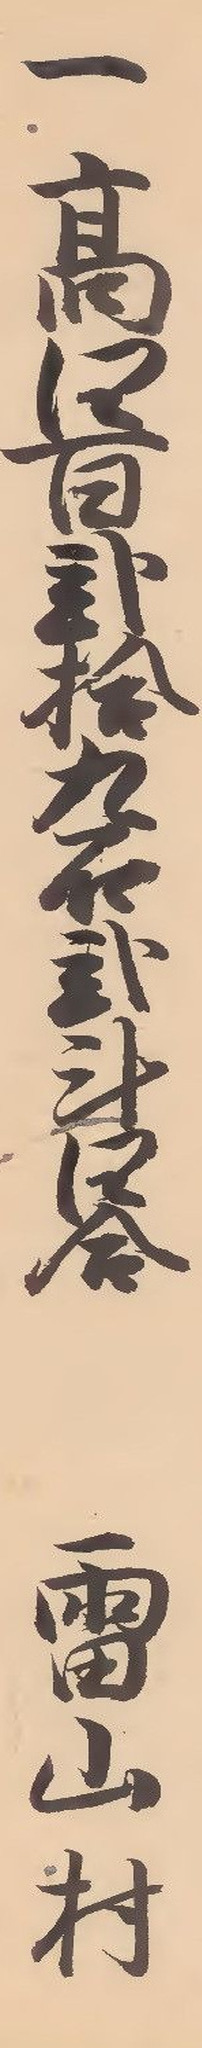一高四百弐拾九石弐斗四合雷山村

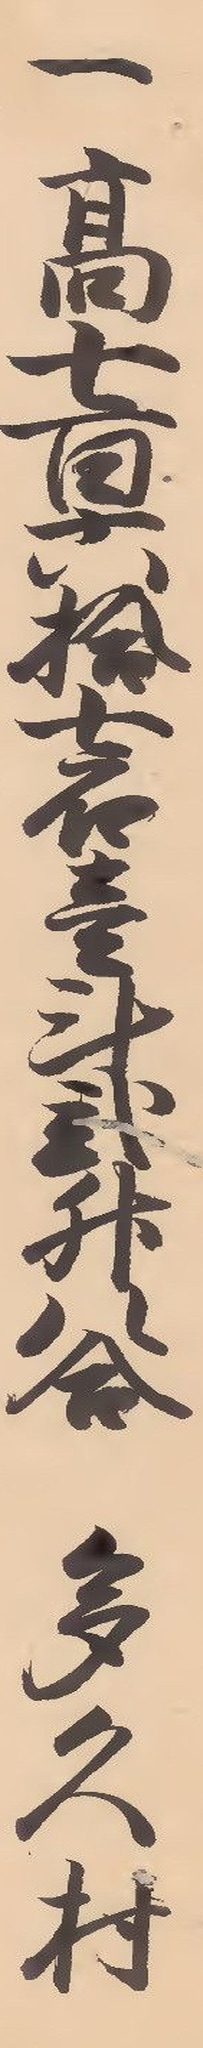一高七百六拾七石壱斗弐升八合多久村
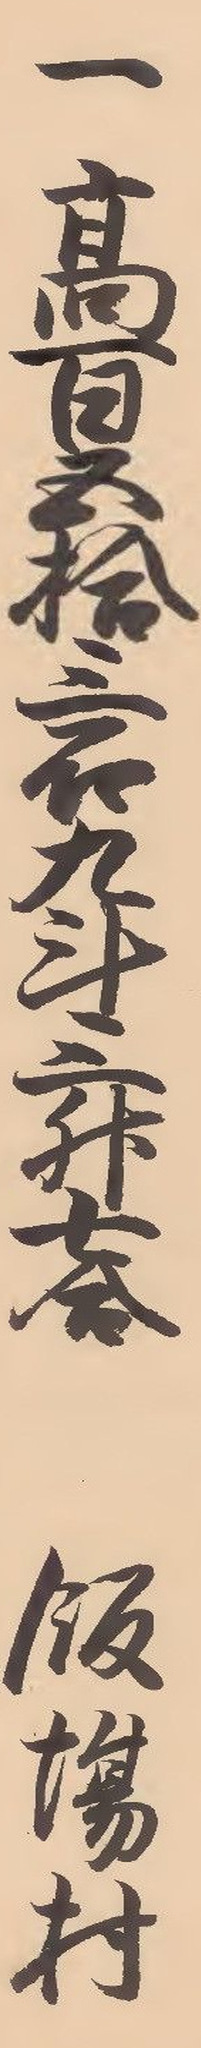一高百五拾三石九斗三升七合飯場村
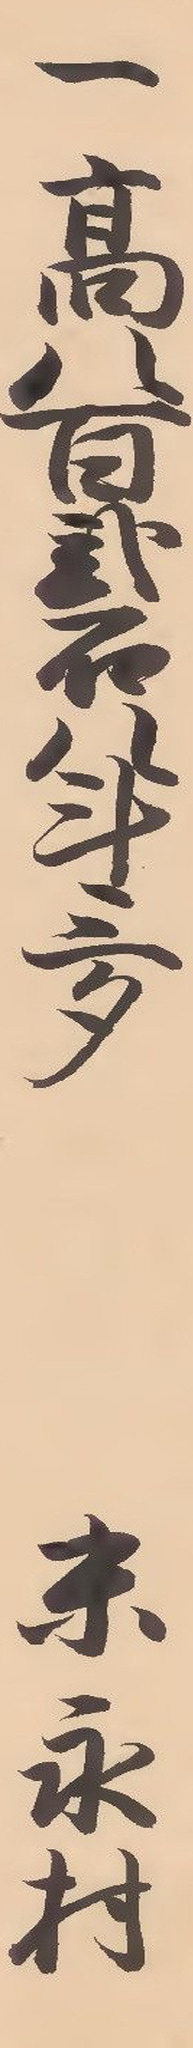一高八百弐石八斗三勺未永村
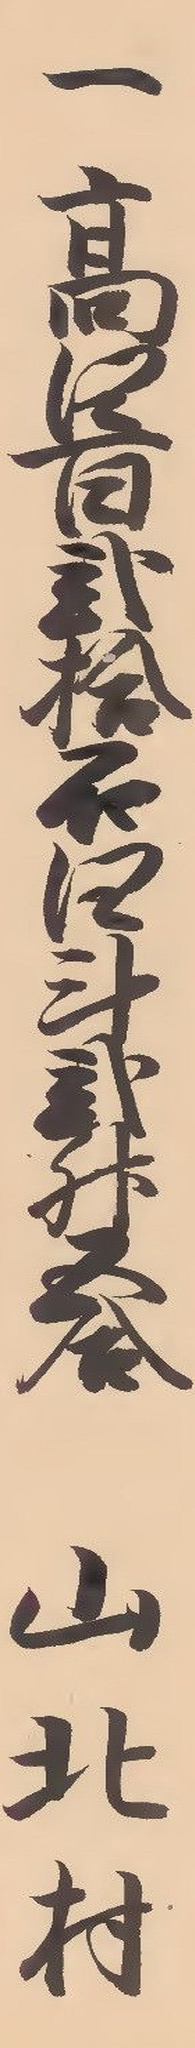一高四百弐拾石四斗弐升五合山北村
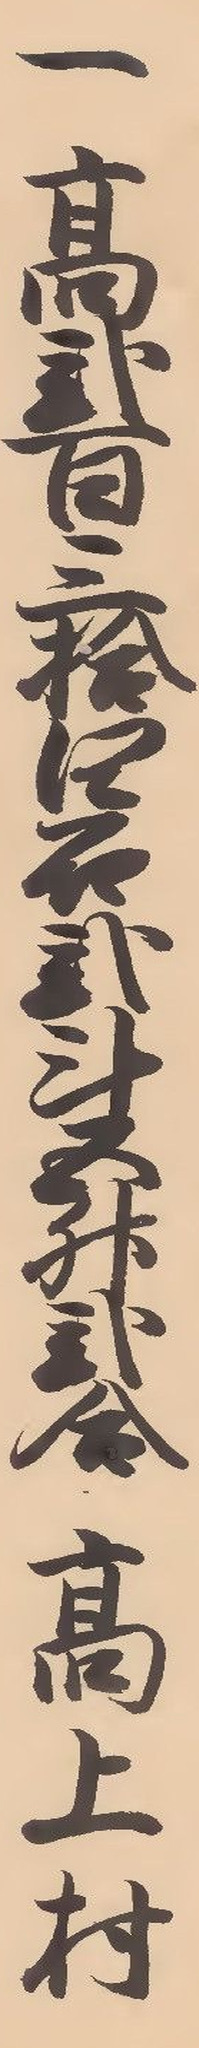一高弐百三拾四石弐斗五升弐合高上村
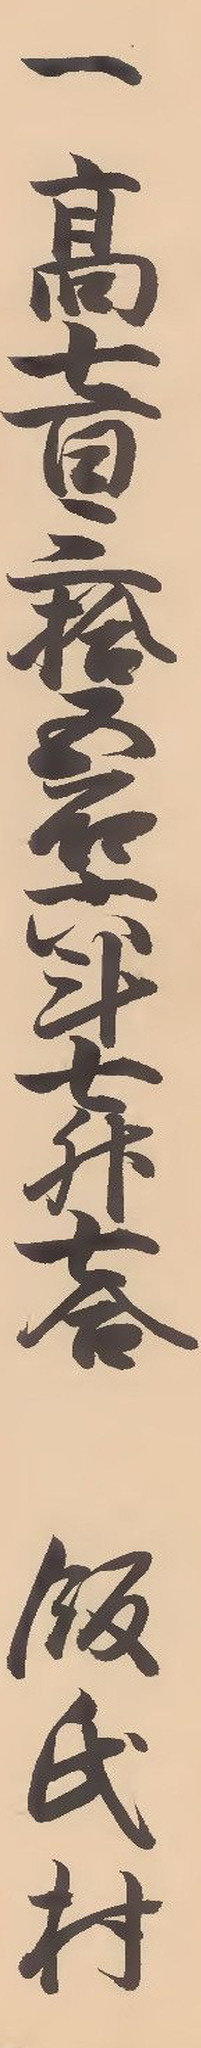一高七百三拾五石六斗七升七合飯氏村
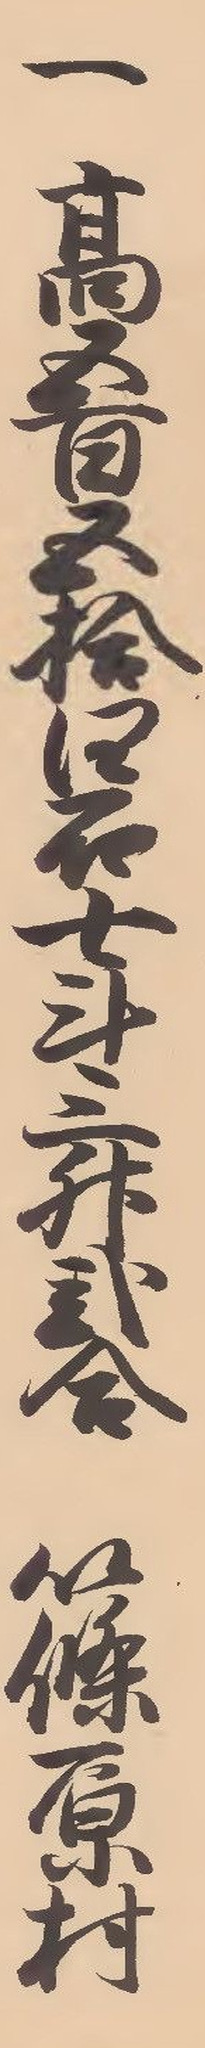一高五百五拾四石七斗三升弐合篠原村
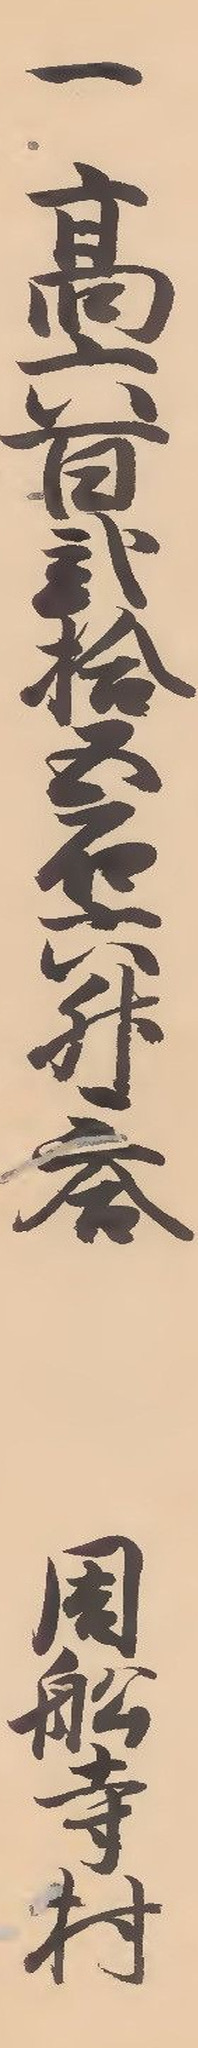一高六百弐拾五石六升三合周船寺村
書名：筑前国郷帳
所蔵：国立公文書館 National Archives of Japan
